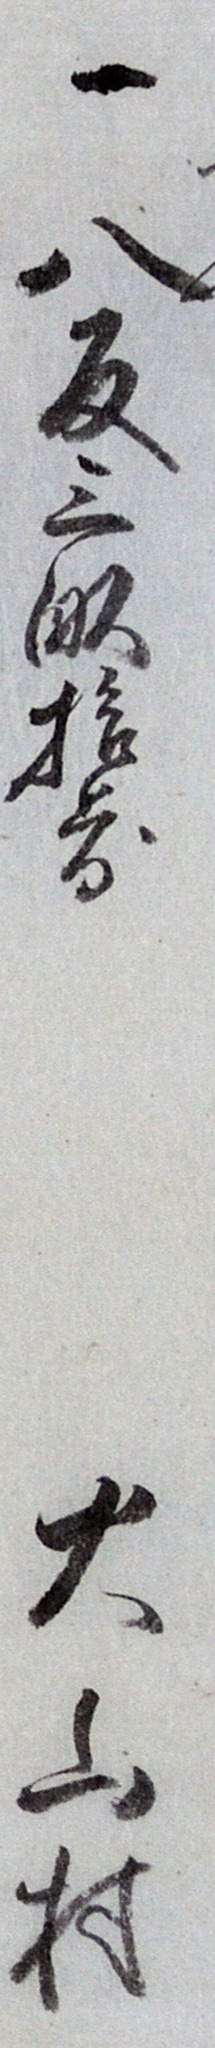一八反三㽗拾歩火山村
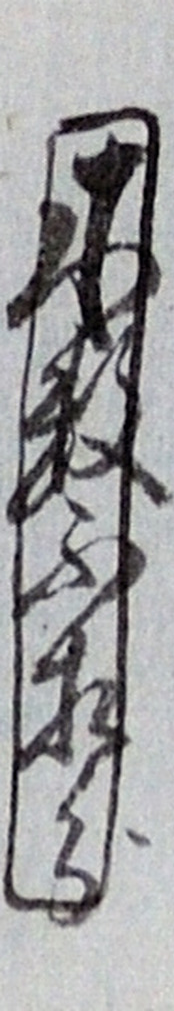木数不相分
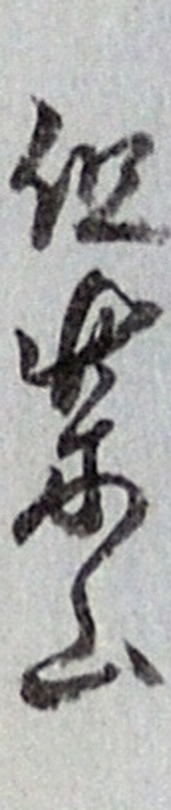但芝山
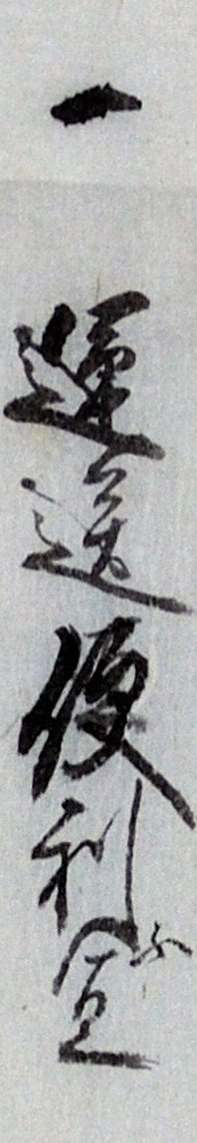一運送便利不宜
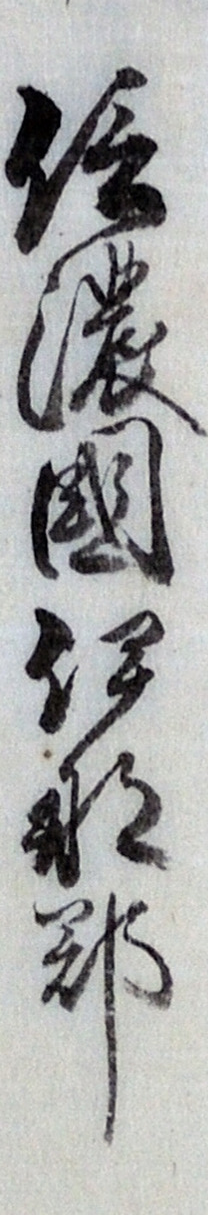信濃国伊那郡
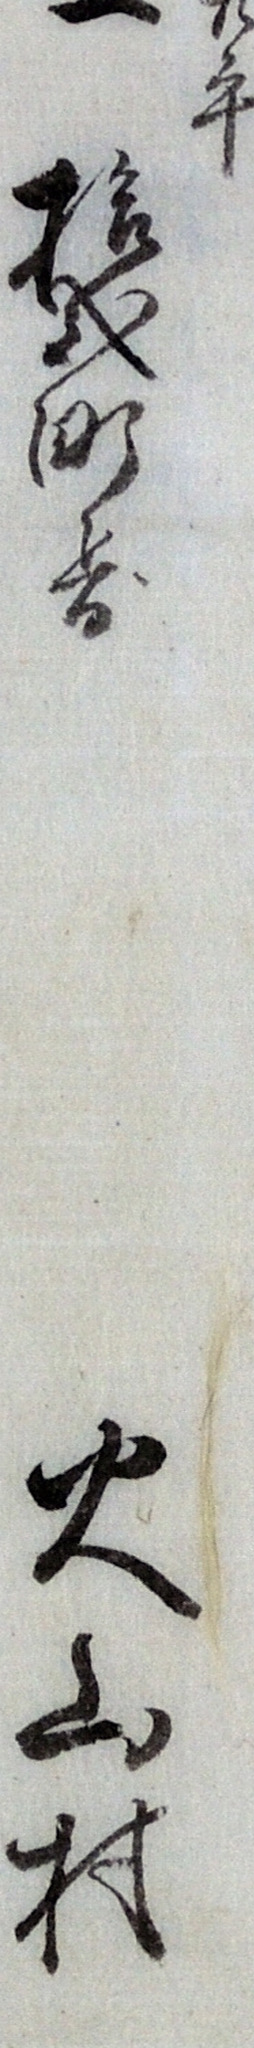一拾弐町歩火山村
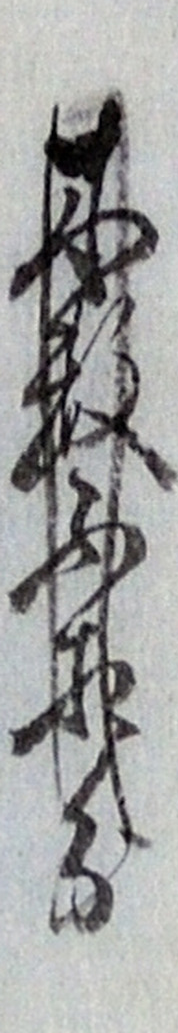木数不相分
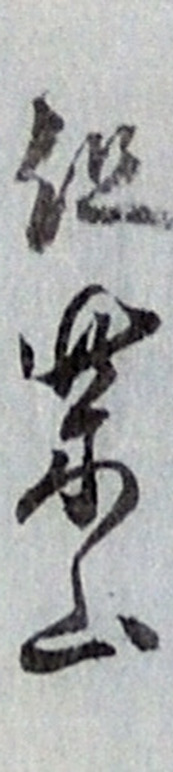但芝山
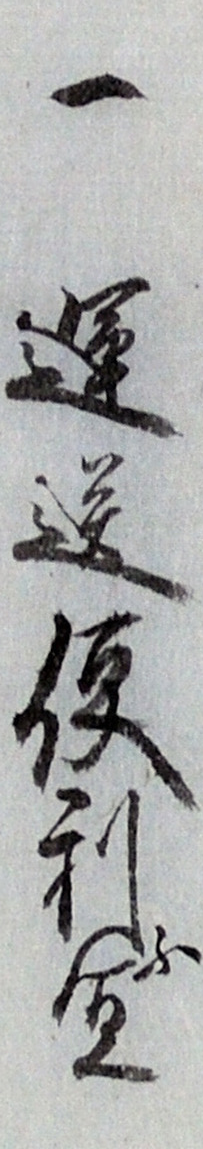一運送便利不宜
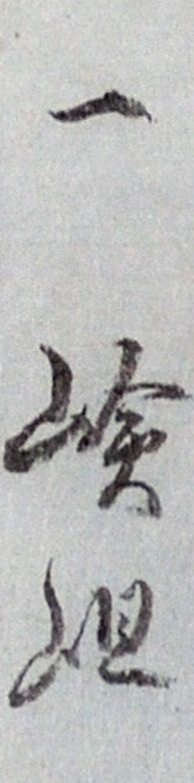一嶮岨

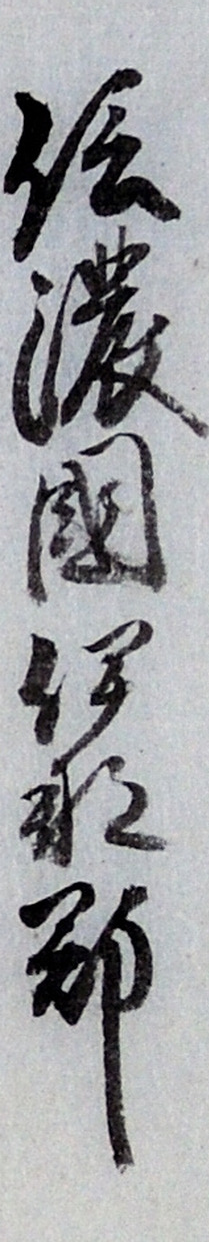信濃国伊那郡
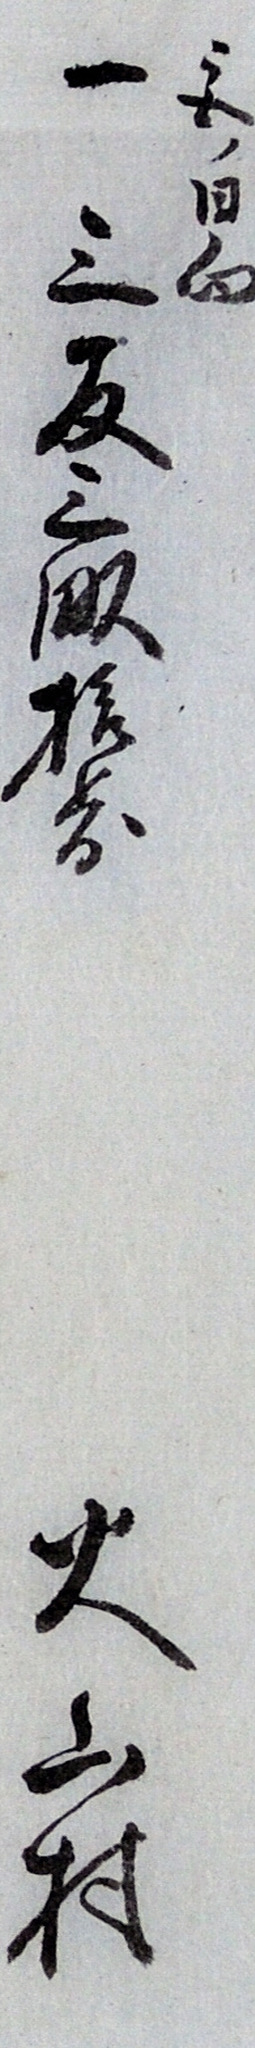一三反三㽗拾歩火山村
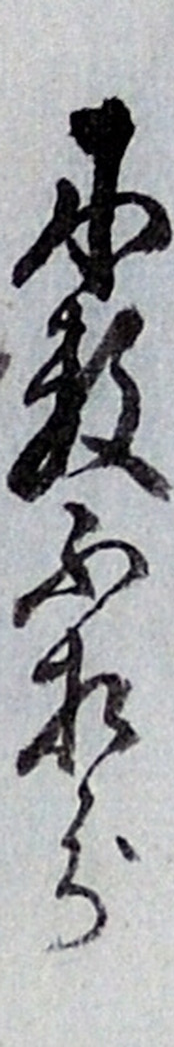木数不相分
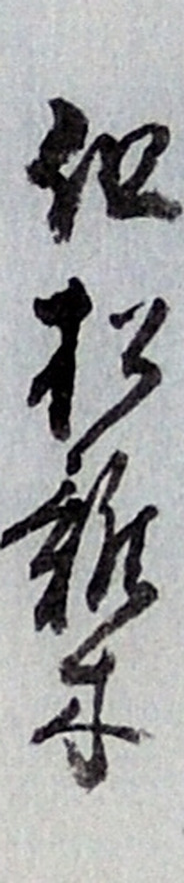但松雑木
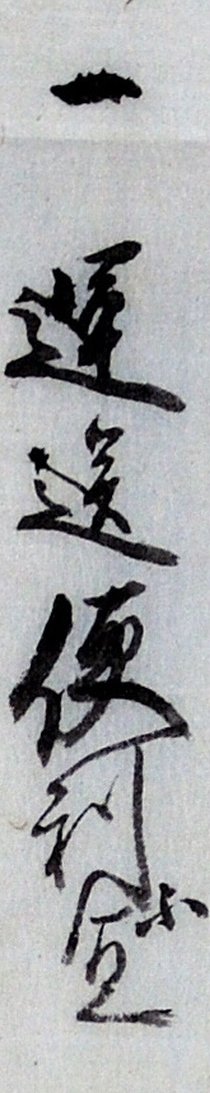一運送便利不宜
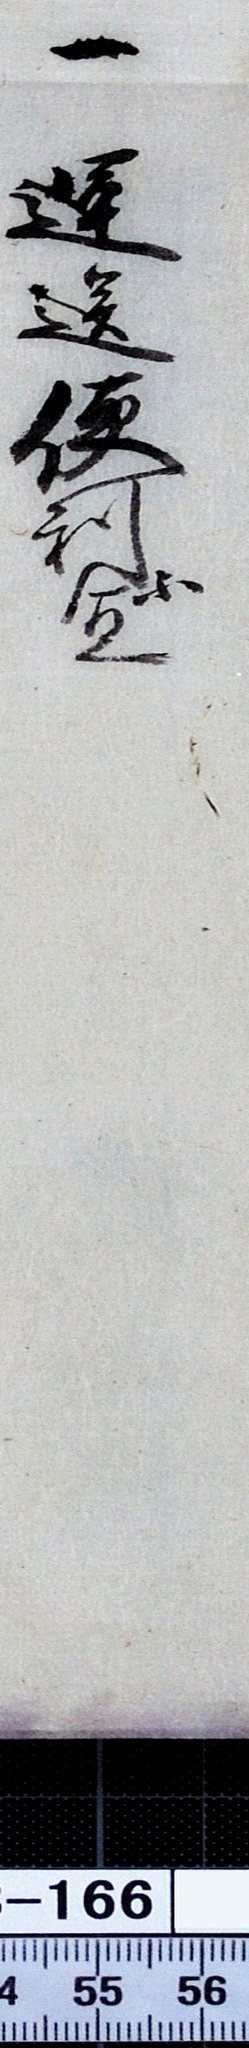一運送便利不宜
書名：官林反別帳
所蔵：伊那市立高遠町図書館・合同会社AMANE
